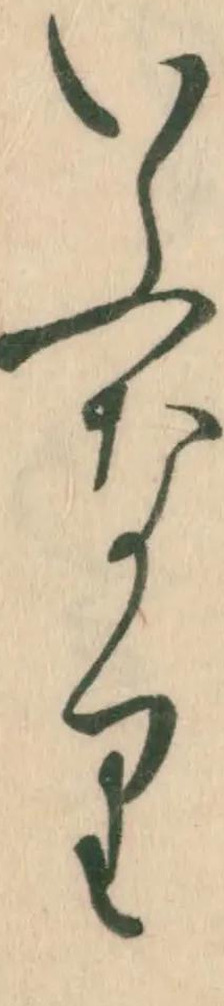いふなり
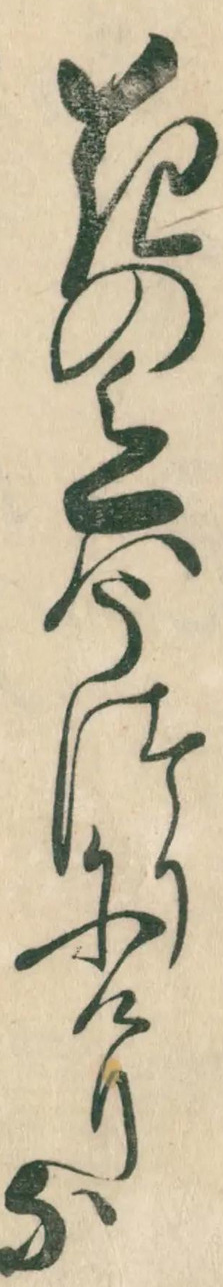花の色はうつりにけり
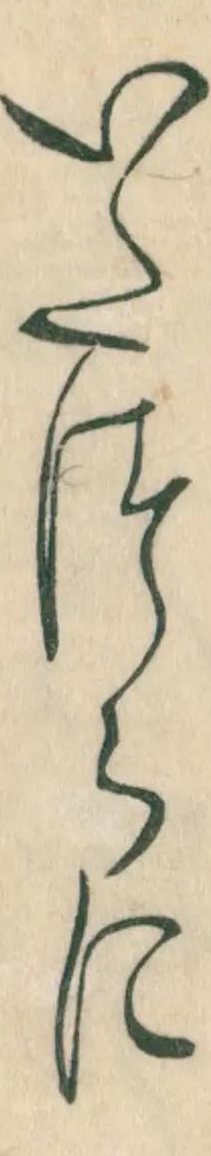いたつらに
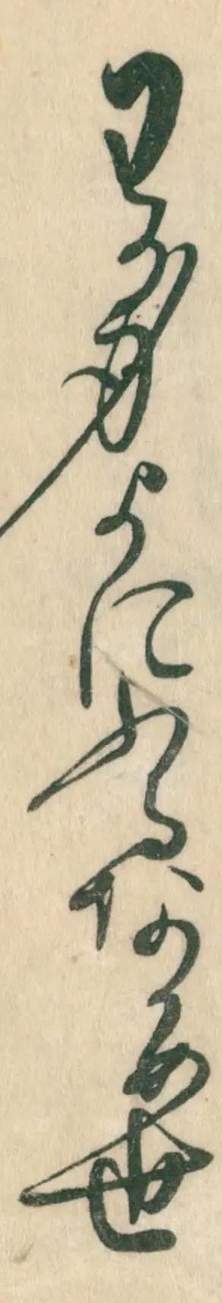わか身よにふるなかめせ
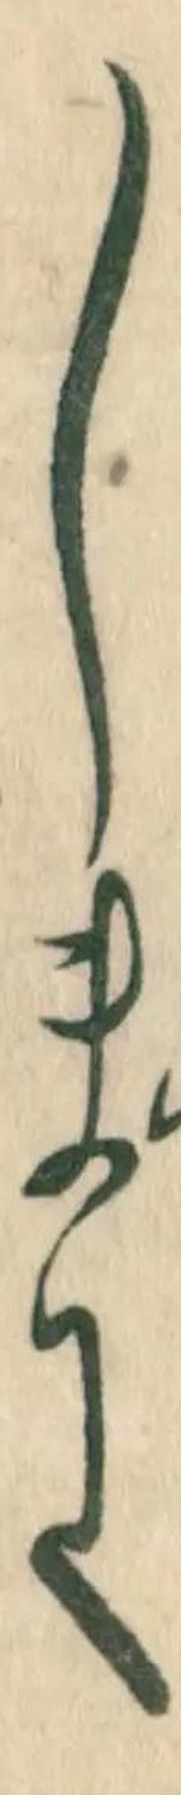しまに

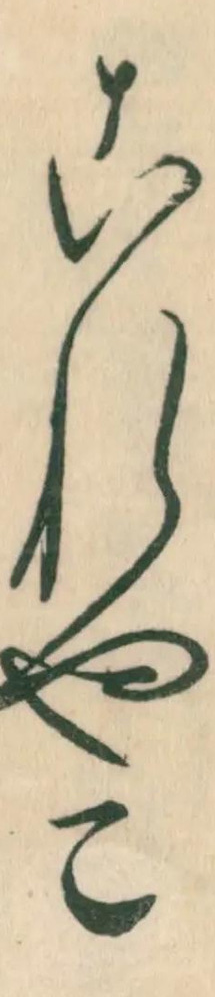これやこ
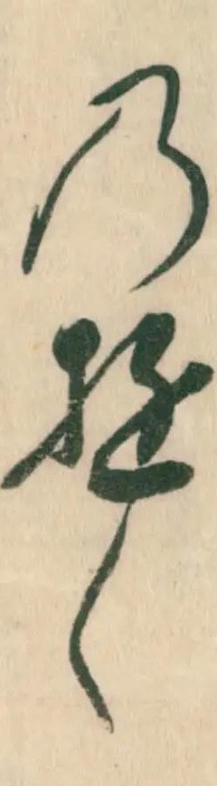のゆく
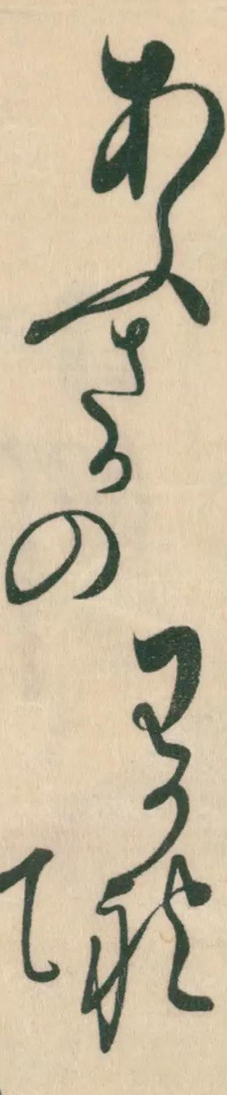あふさかわかれ
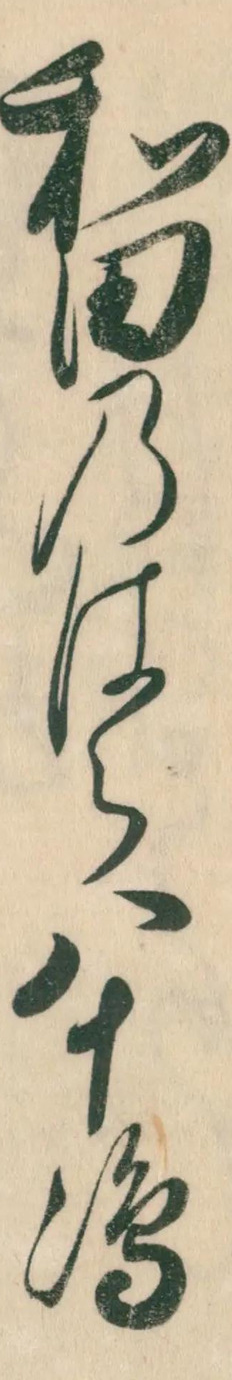和田のはら八十嶋
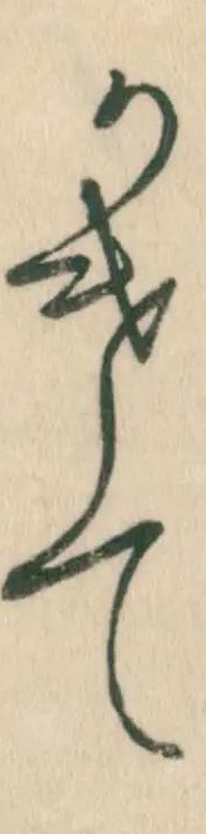かけて
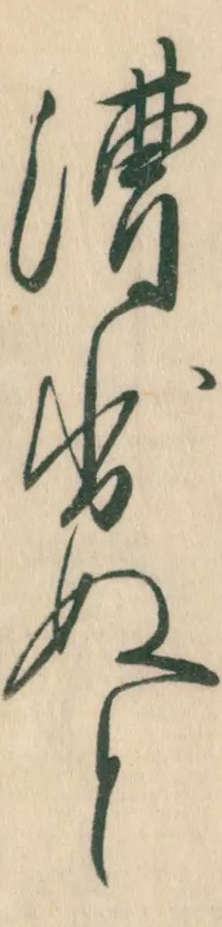漕出ぬと
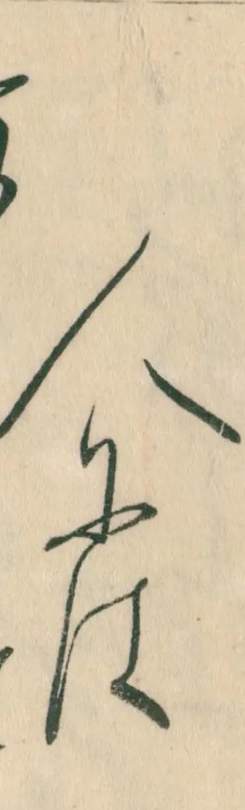人には
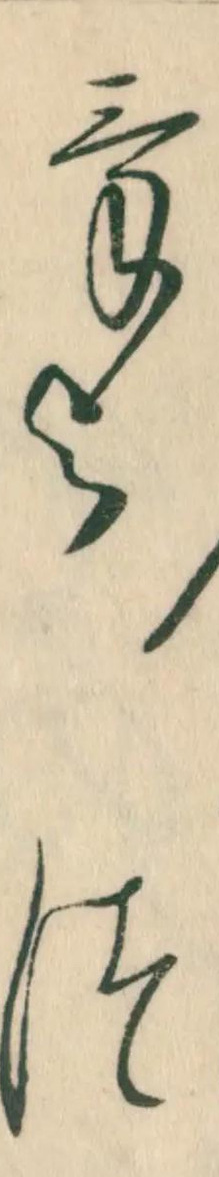けよつ
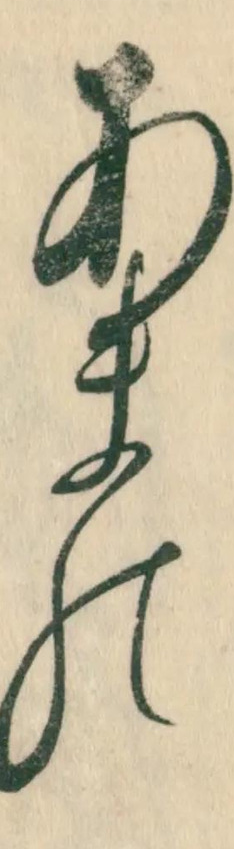あまの
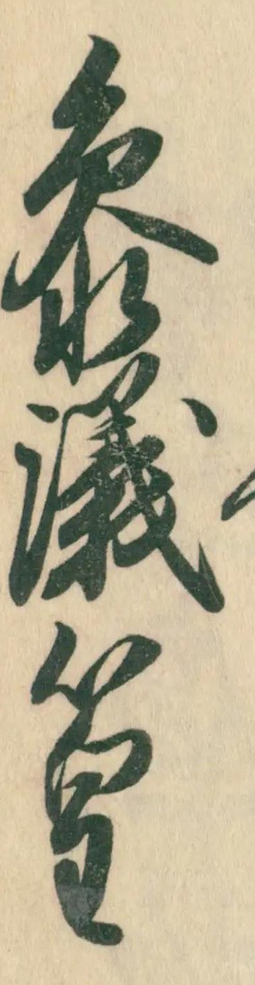参議篁

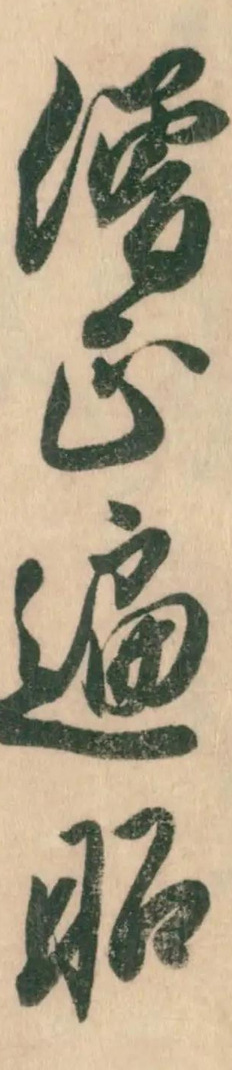僧正遍昭
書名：錦百人一首あつま織
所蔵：国立国会図書館 National Diet Library, JAPAN
